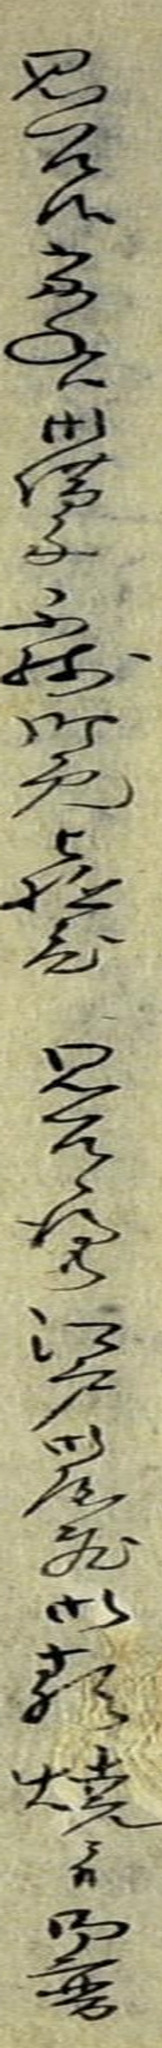思召候当年ハ御借米不残御免被遊度思召候得共江戸御屋敷御類焼ニ付御普
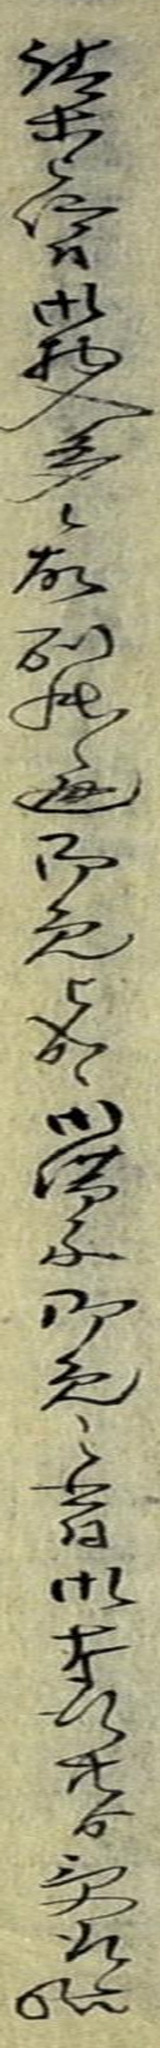請等被仰付御物入多候故別紙之通御免被成候御借米御免之書付御奉行共ゟ受取候
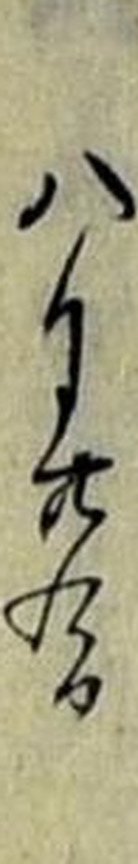八月廿九日
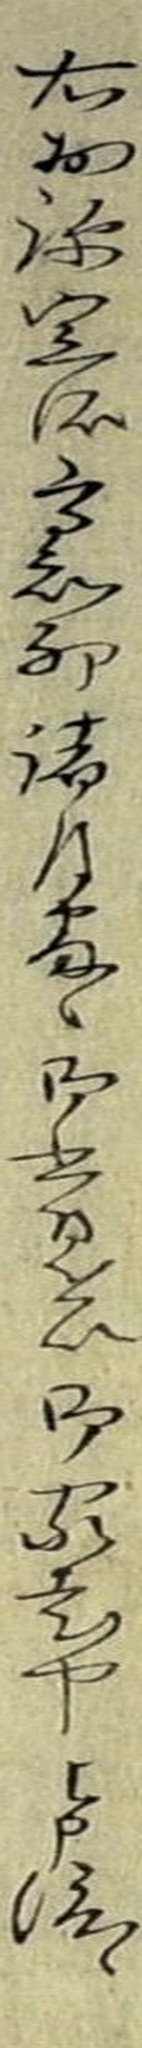右於評定所高知初諸月番へ御書付を以御家老中被申渡候
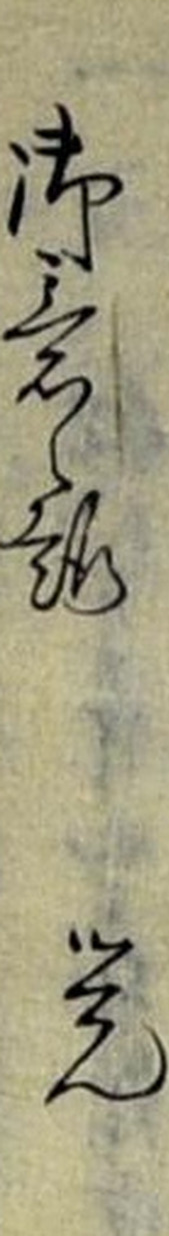御意之趣覚
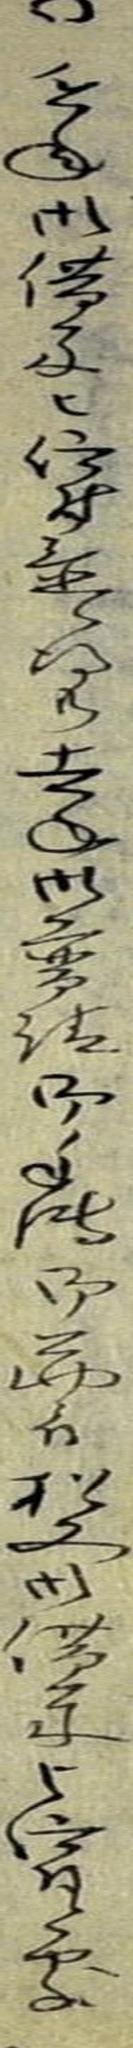〇近年御借米被仰付置候得共去年御普請御手伝御勤ニ付猶又御借米被仰付候処
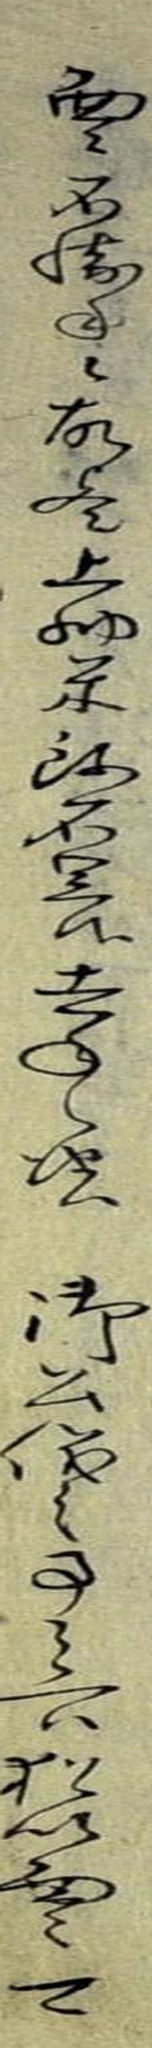面々不勝手候故歟上納米致不足候去年之儀ハ御公儀之事ニ候ヘハ猶以面々可
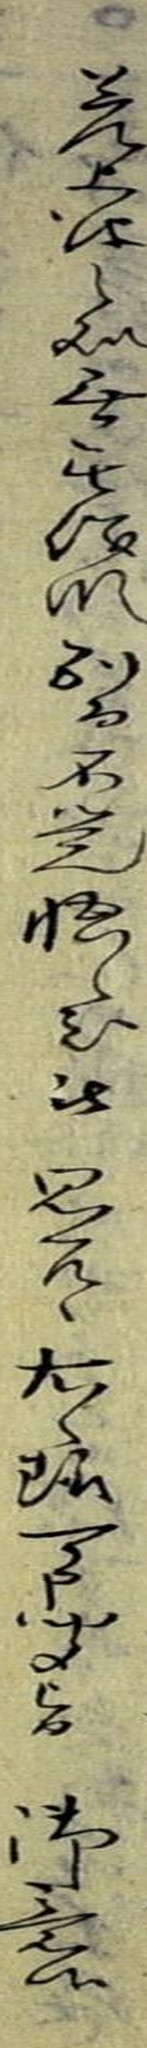差上儀候処無其儀段別而不覚悟之至被思召候右之趣可申聞旨御意候
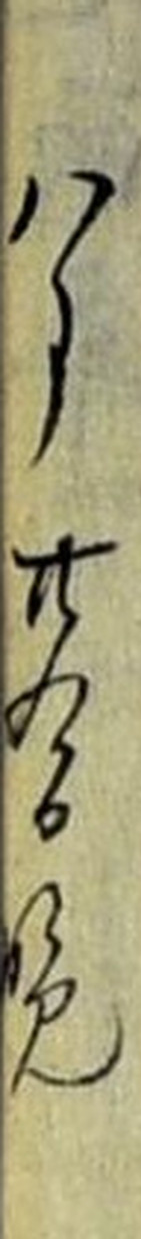八月廿九日晩
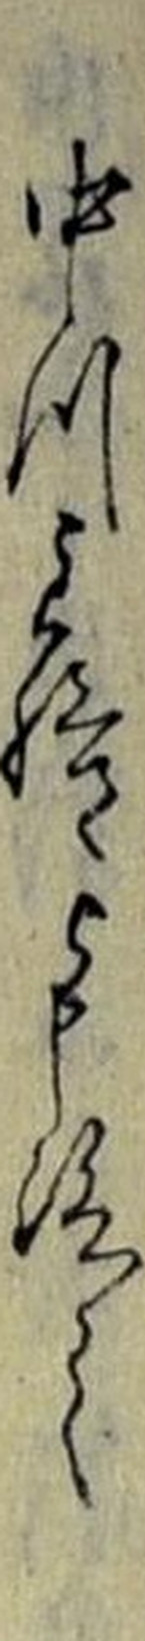中川主膳へ被申渡之
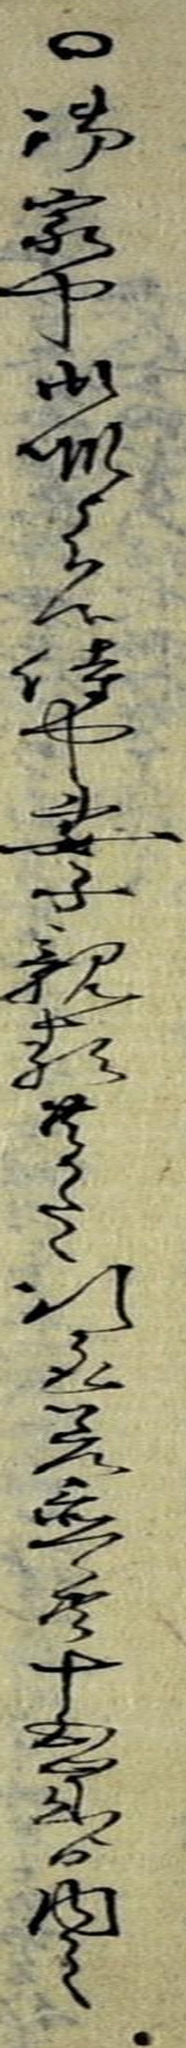〇御家中御暇被下候侍中妻子親類共かたへ引取差置候共十五歳ゟ内之
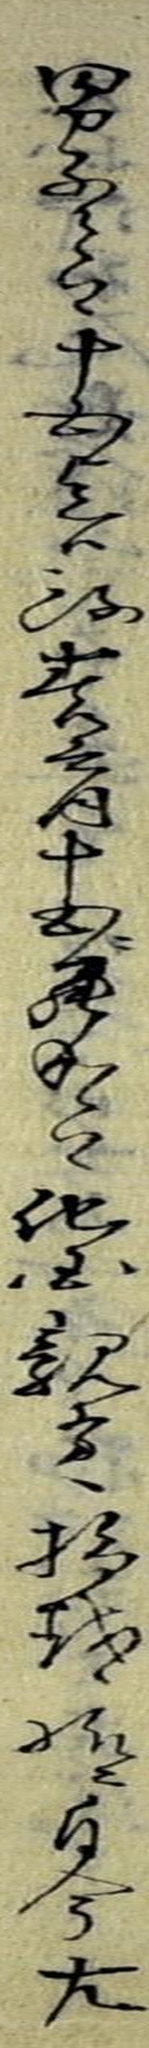男子ニ候ハヽ十五迄ハ致養育十五ニ罷成候ハヽ他国親方へ指越候様ニ自今左
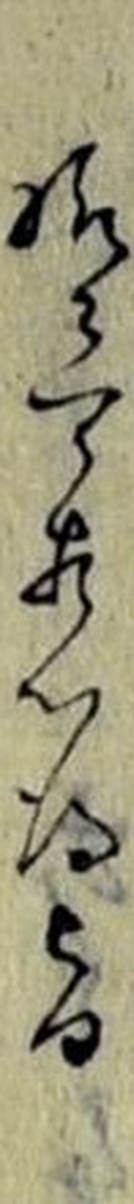様ニ可相心得旨
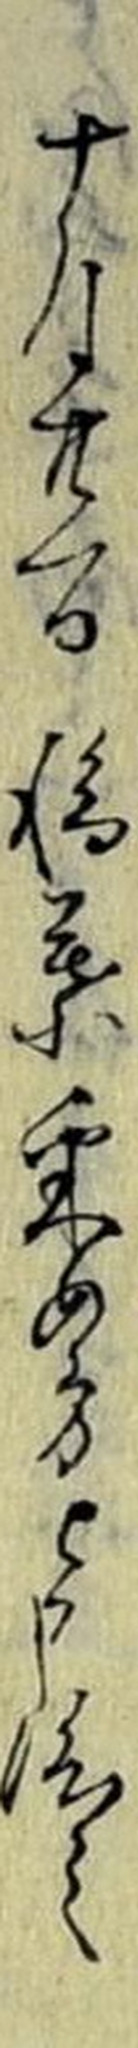十月廿一日稲葉采女方被申渡之
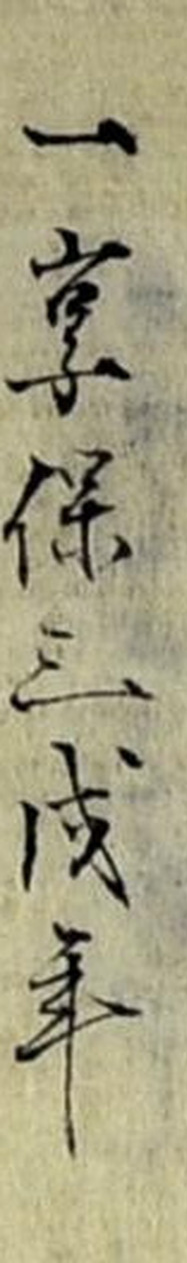一享保三戌年
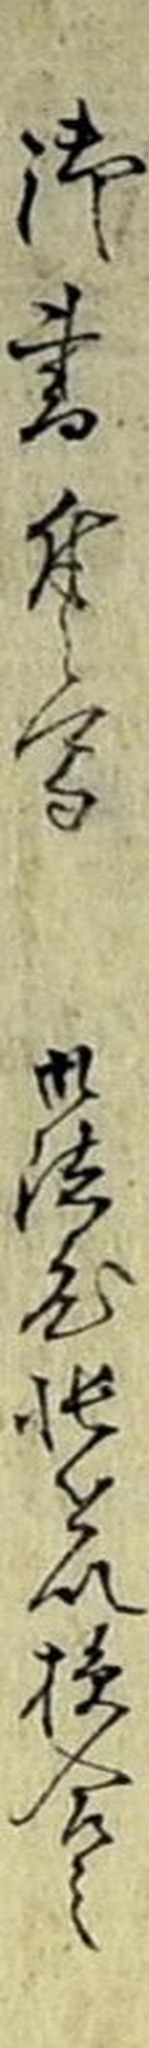御書付之写御法度帳を以校合之
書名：命令之部 一
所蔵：福井県文書館 Fukui Prefectural Archives
